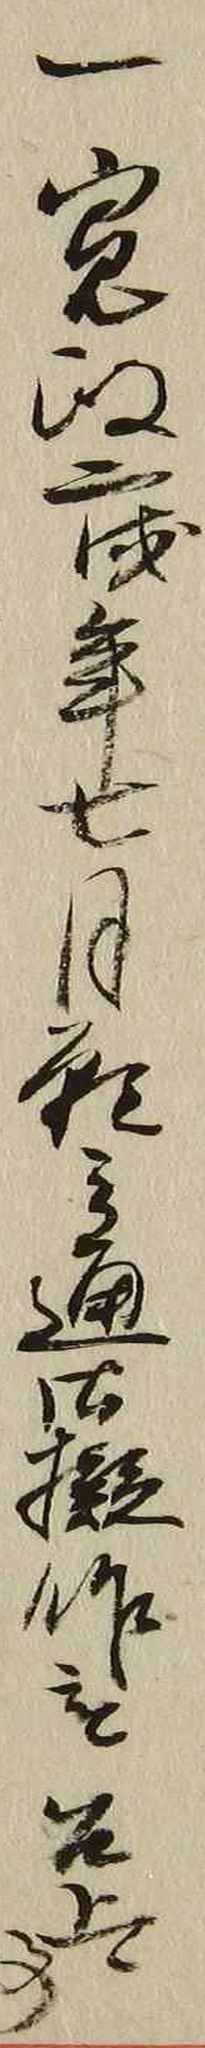一寛政二戌年七月願之通御擬作被召上候事
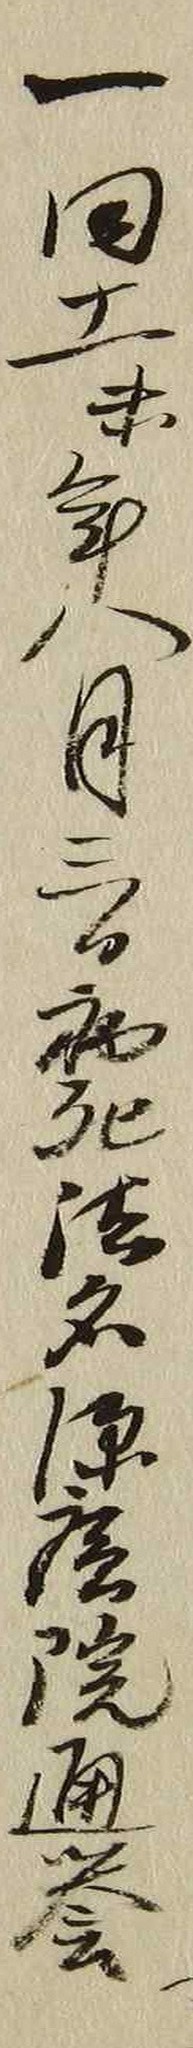一同十一未年八月三日病死法名源広院通誉
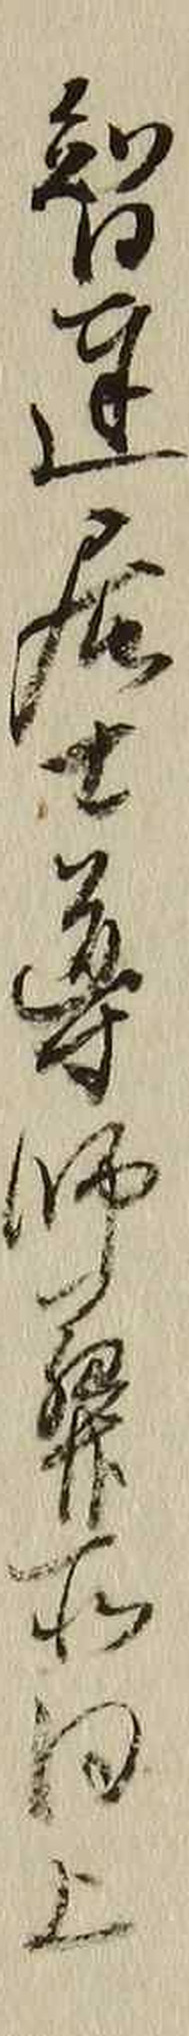智達居士導師葬所同上
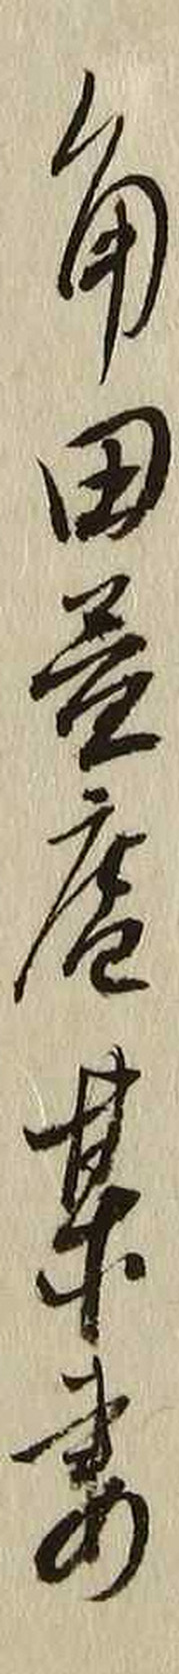女角田益庵某妻
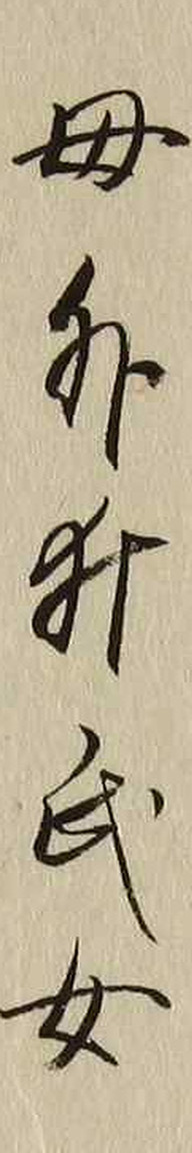母外井氏女
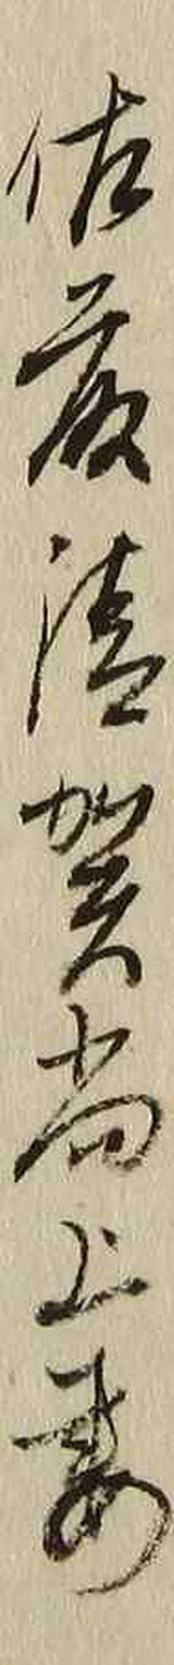女佐藤清賀尚上妻
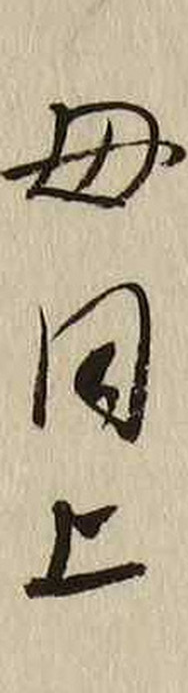母同上
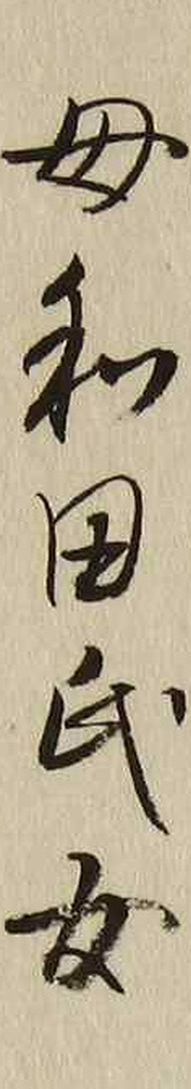母和田氏女
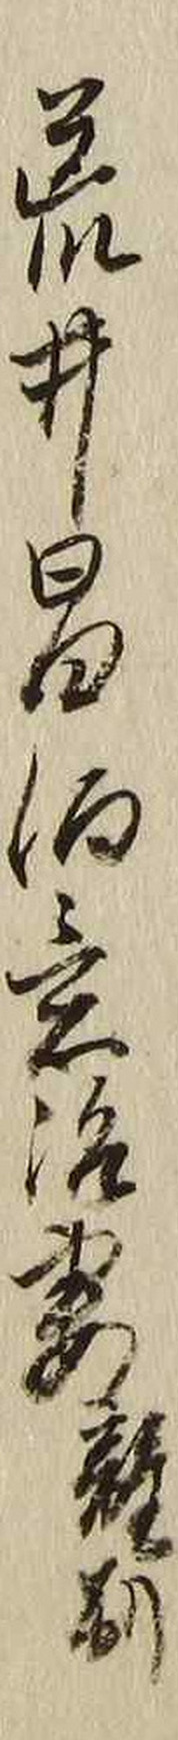女荒井昌伯意治妻離別
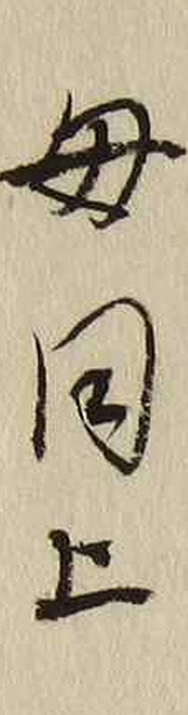母同上

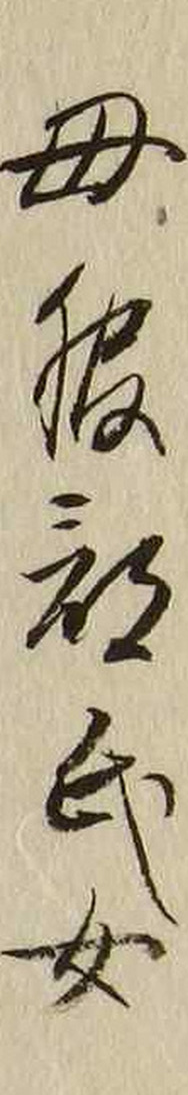母服部氏女
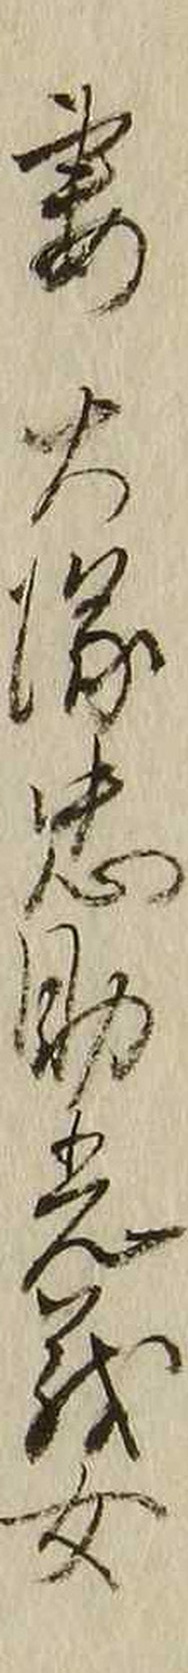妻大塚忠助光茂女
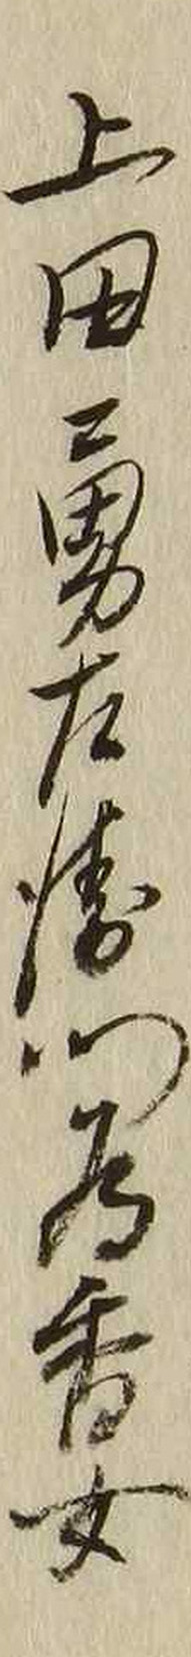上田勇左衛門為香女
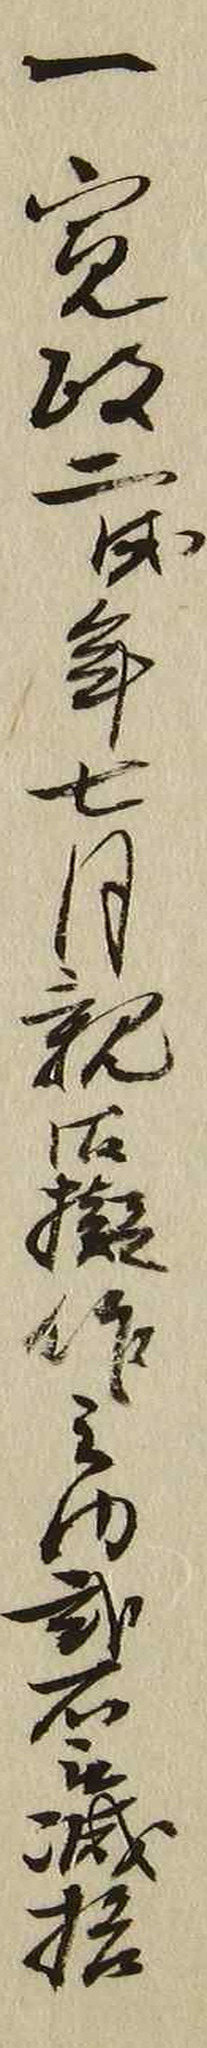一寛政二戌年七月親御擬作之内弐石被減拾
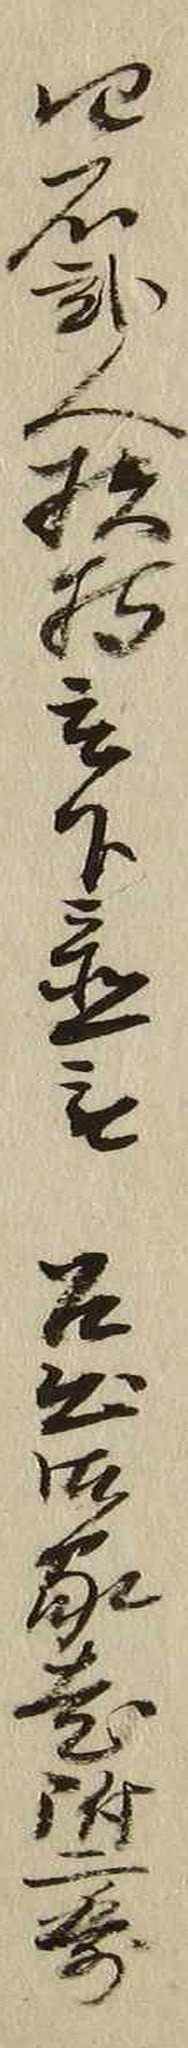四石弐人扶持被下置被召出御家老附二寄
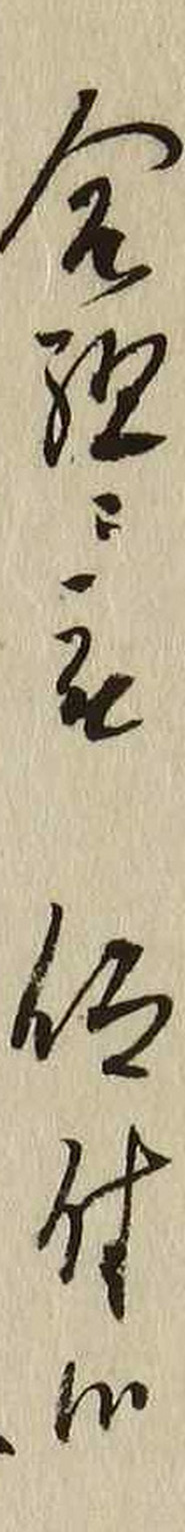合組被仰付候
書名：諸士系譜　巻之350　せ之部1冊全
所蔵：会津若松市立会津図書館
